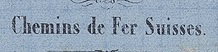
Chemins de Fer Suisses.
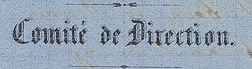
Comité de Direction.
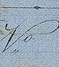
Geneve
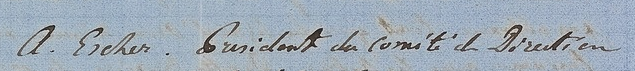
A. Escher. President du Comité de Direction
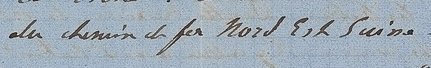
du chemin de fer Nord Est Suisse,
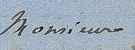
Monsieur
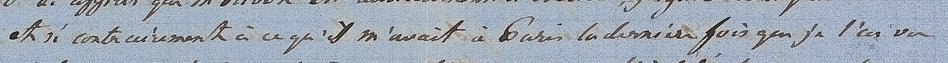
et si contrairement à ce qu'il m'avait à Paris la derniere fois que je l'ai vu
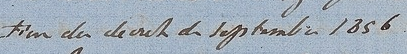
tion du droit de septembre 1856.
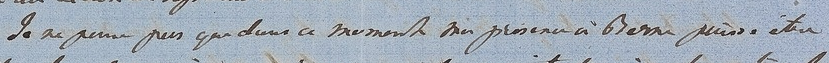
Je ne pense pas que dans ce moment ma presence à Berne puisse être
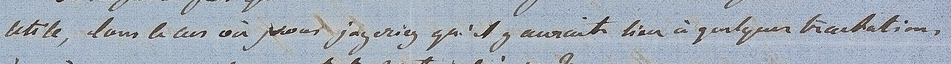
utile, dans le cas où vous jugerez qu'il y aurait lieu à quelques tractations
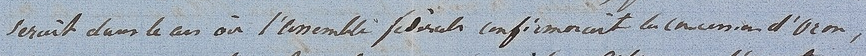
serait dans le cas où l'assemblé fedérale confirmerait la concession d'Oron,
